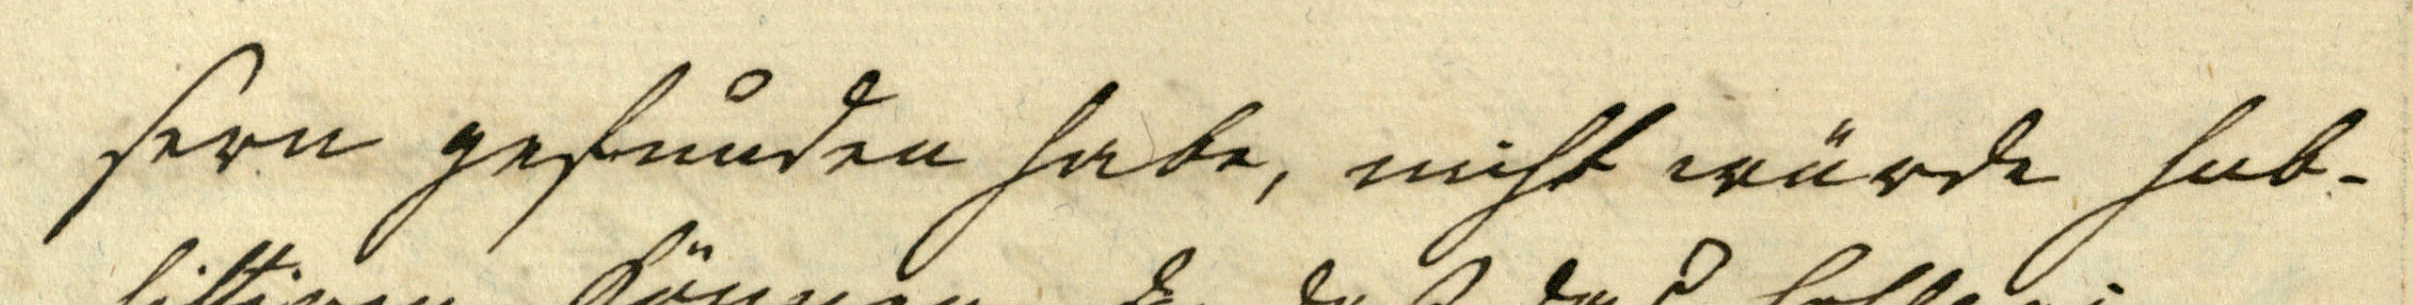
sern gefunden habe, nicht würde sub¬
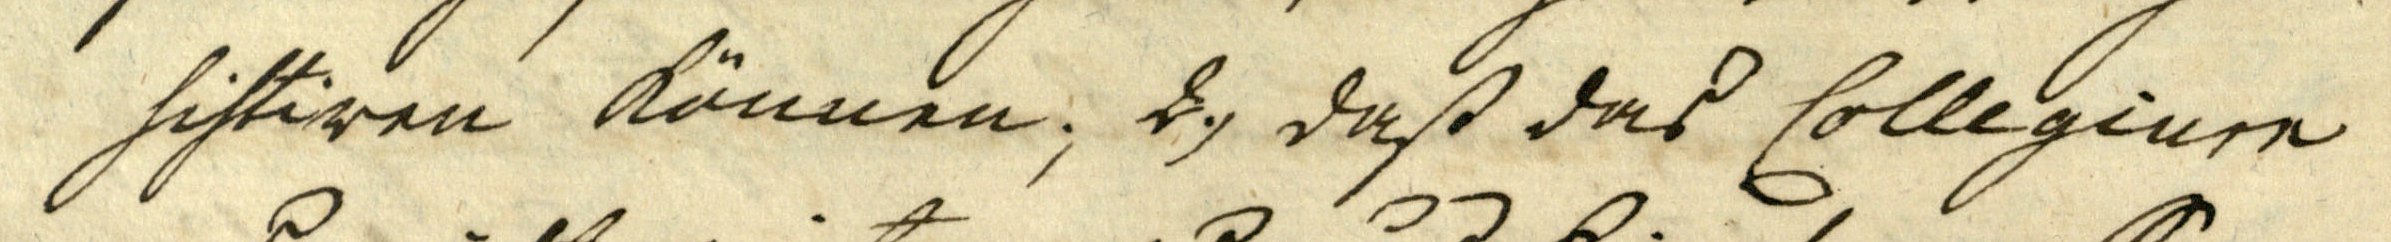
sistiren können; 2., daß das Collegium
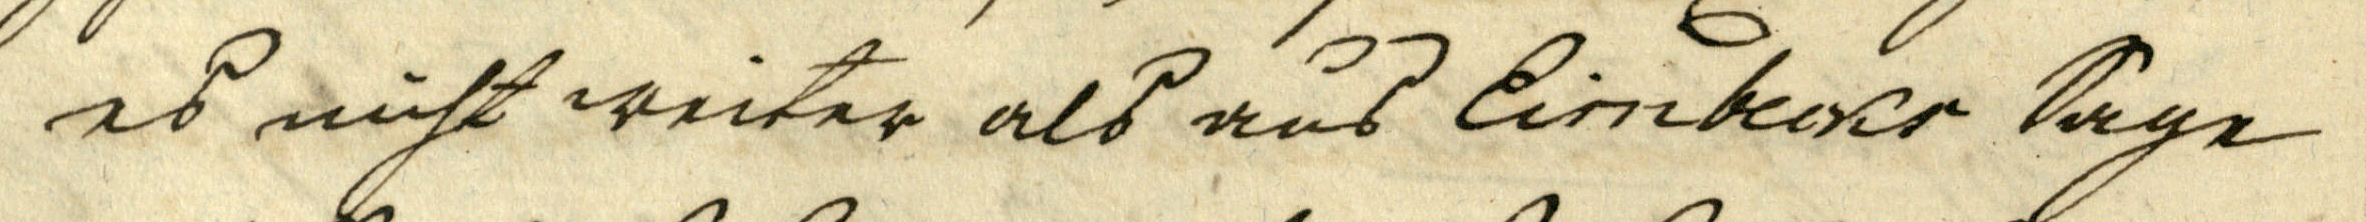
es nicht weiter als aus Eimbecks Sage
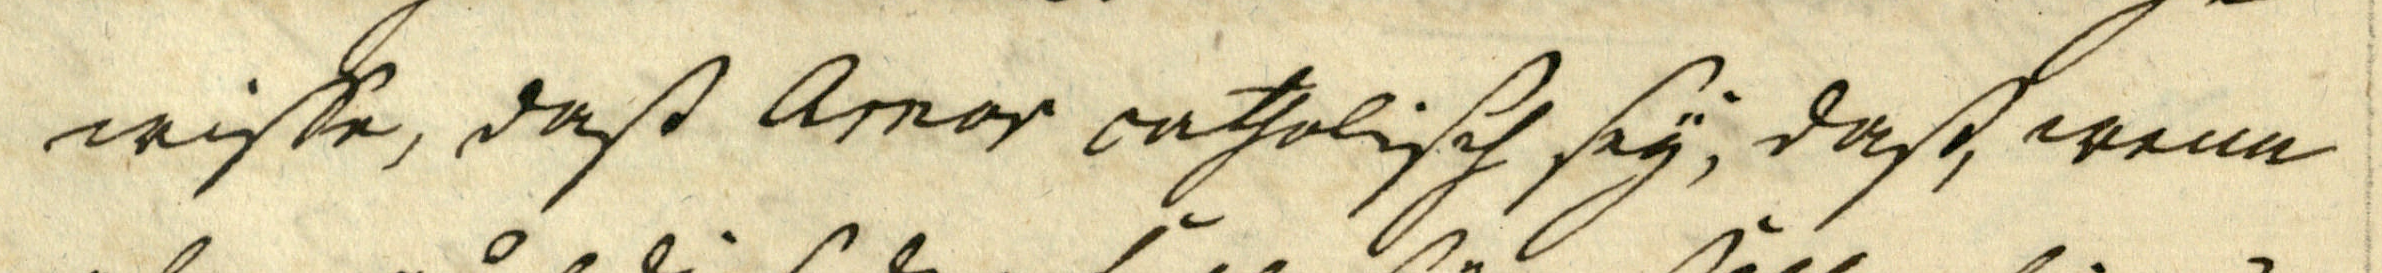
wisse, daß Amor catholisch seÿ; daß, wenn
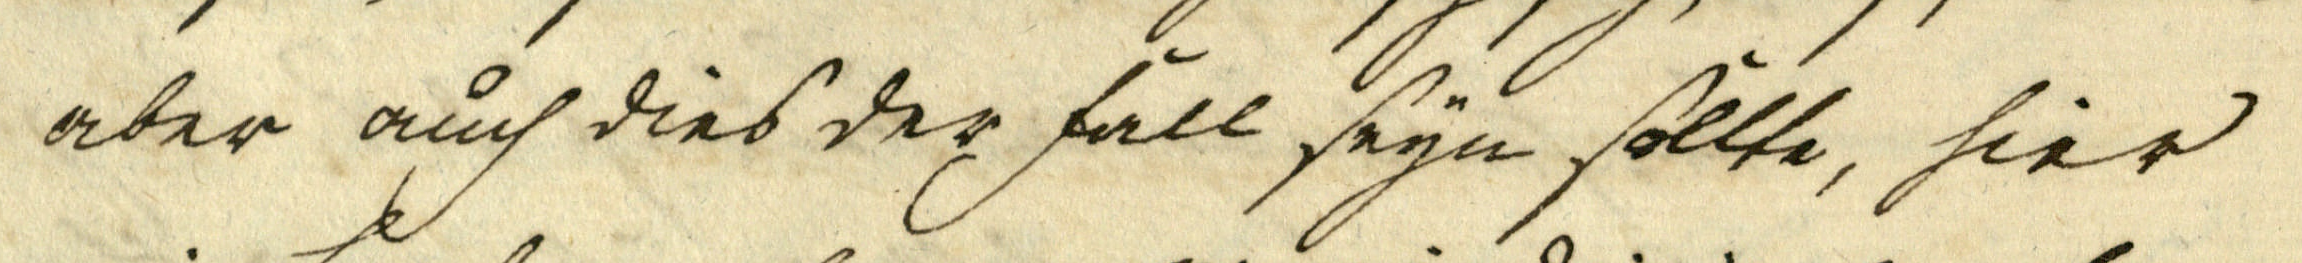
aber auch dies der Fall seÿn sollte, hier
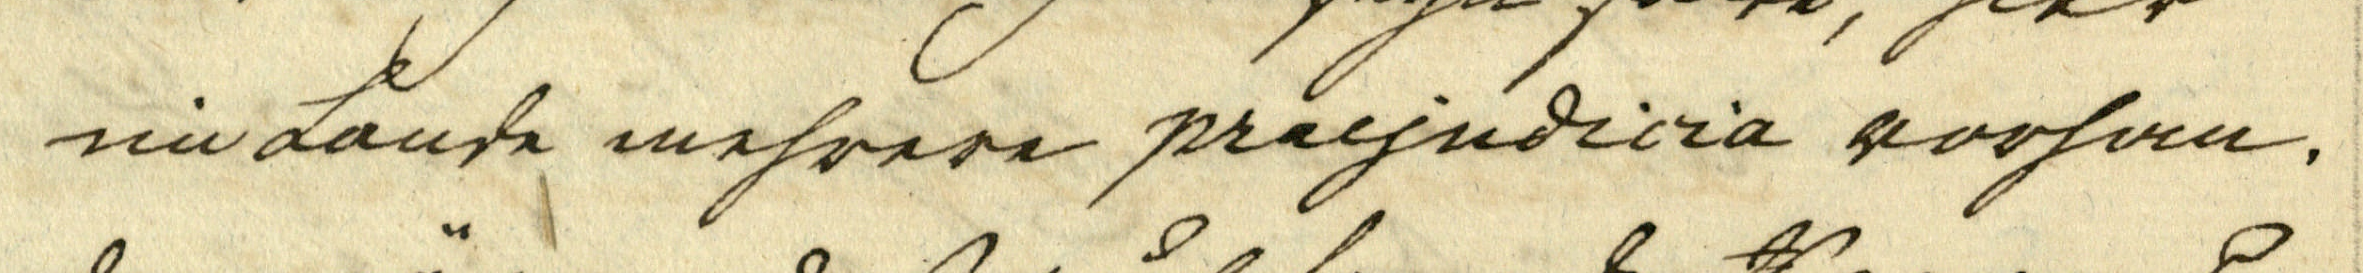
im Lande mehrere praejudicia vorhan¬
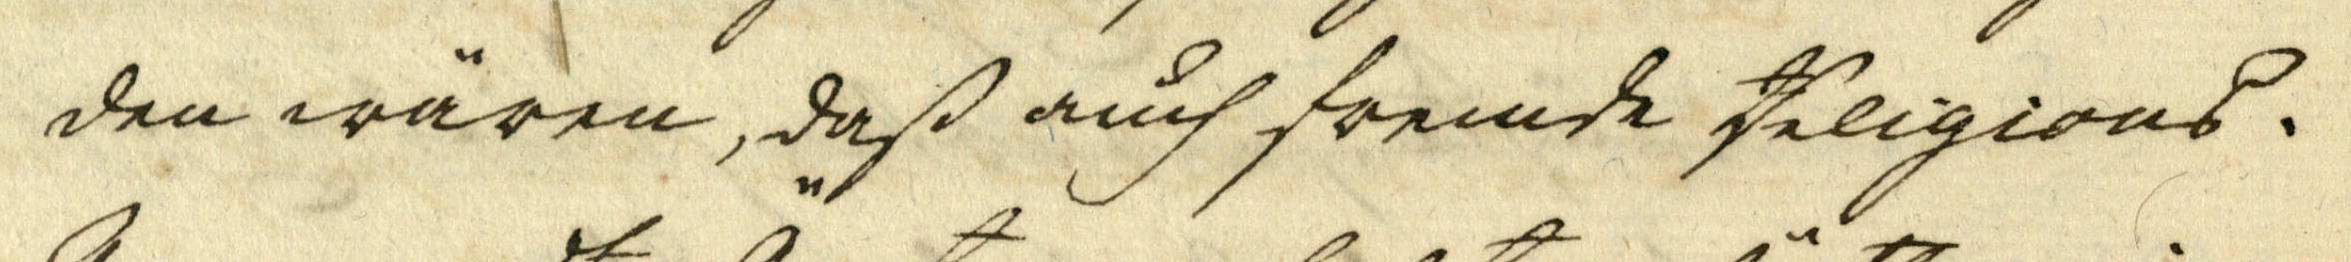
den wären, daß auch fremde Religions¬
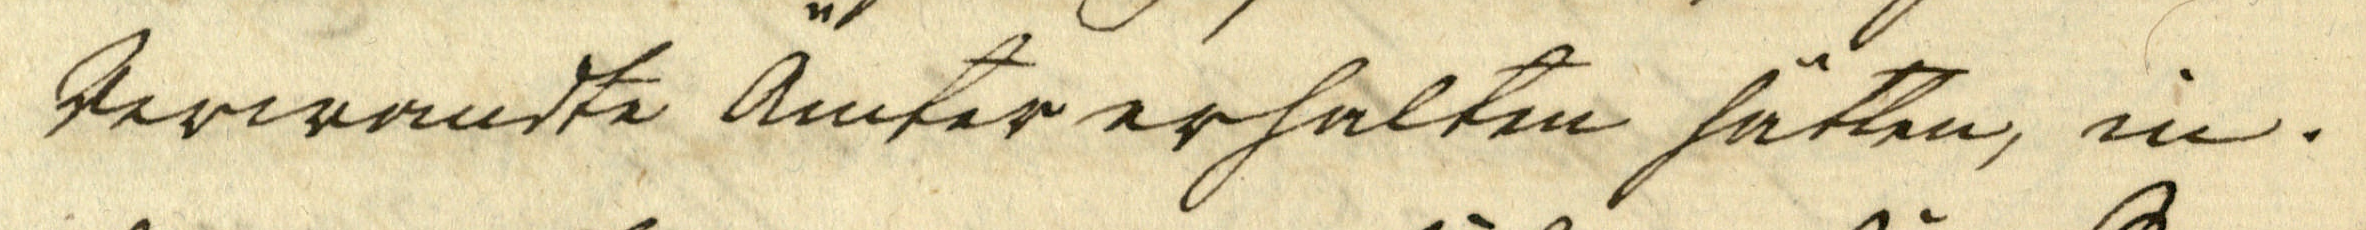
Verwandte Ämter erhalten hätten, in¬
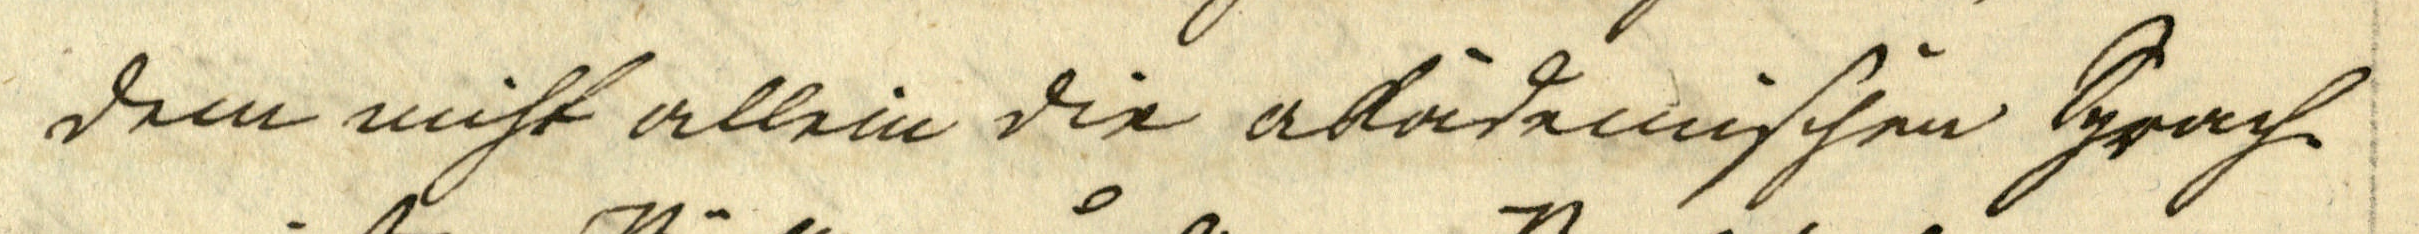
dem nicht allein die akademischen Sprach¬
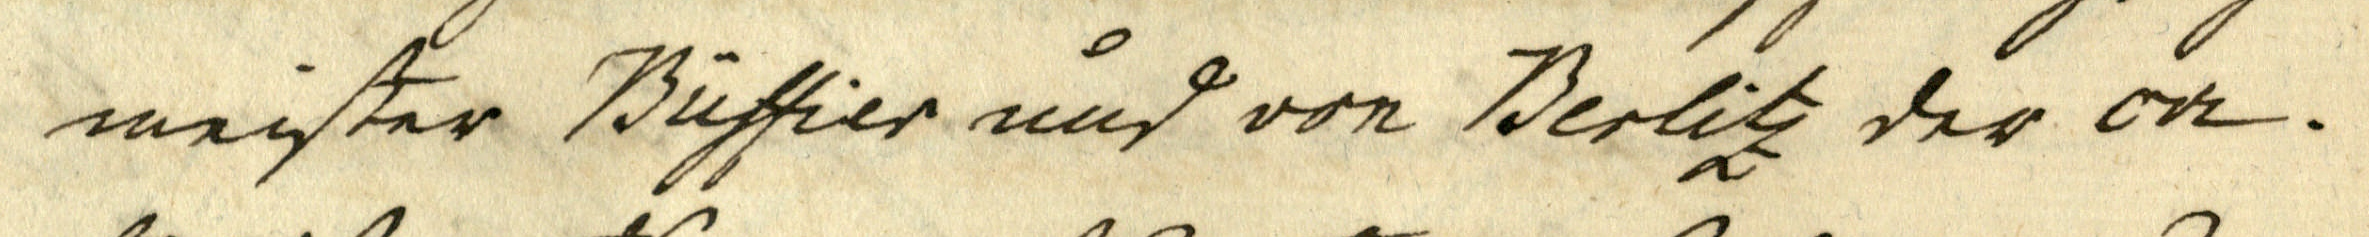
meister Büffier und von Berlitz der ca¬
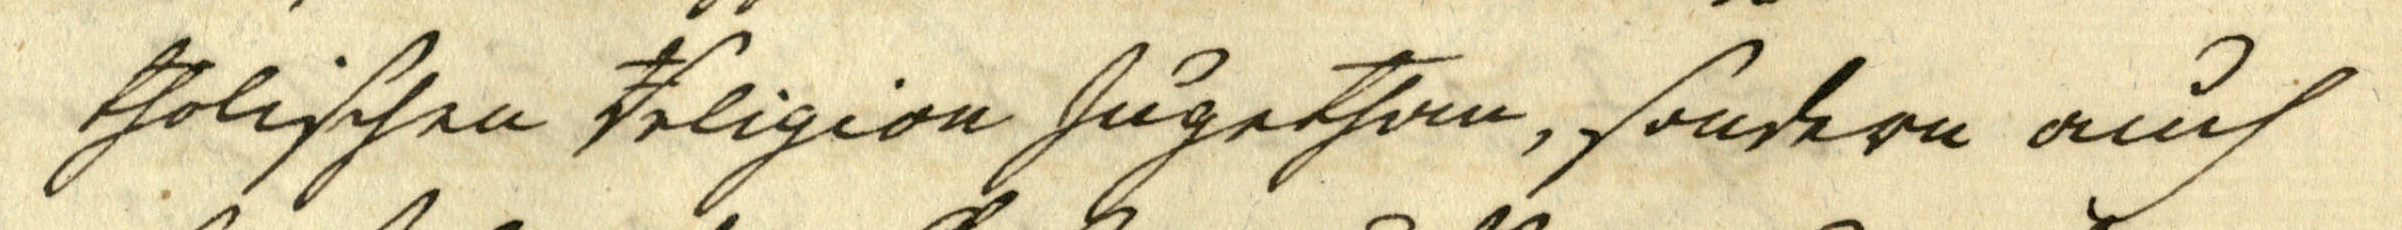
tholischen Religion zugethan, sondern auch
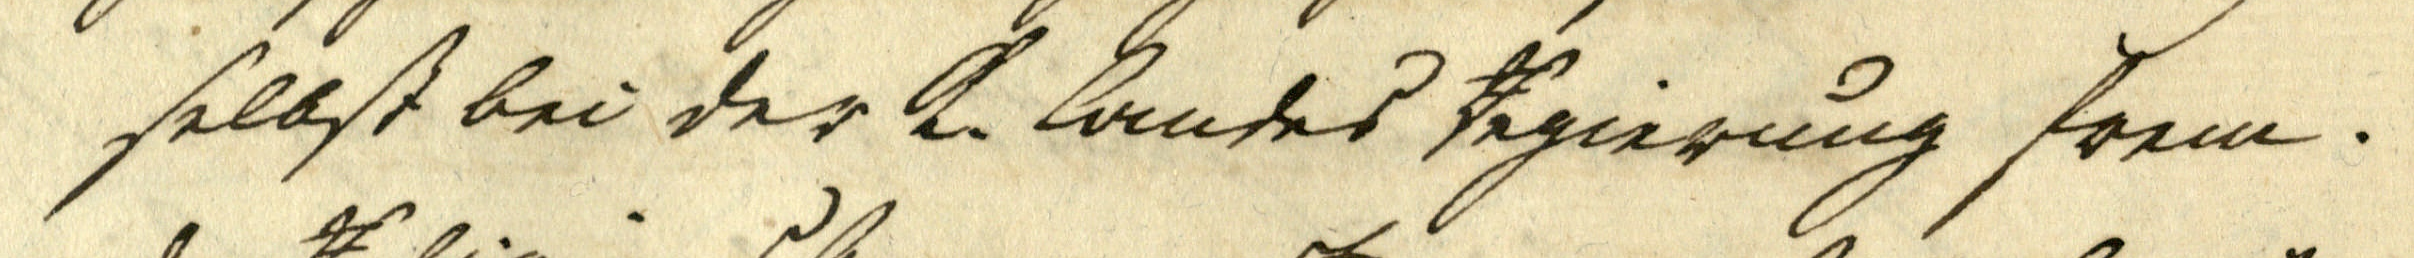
selbst bei der K. Landes Regierung frem¬
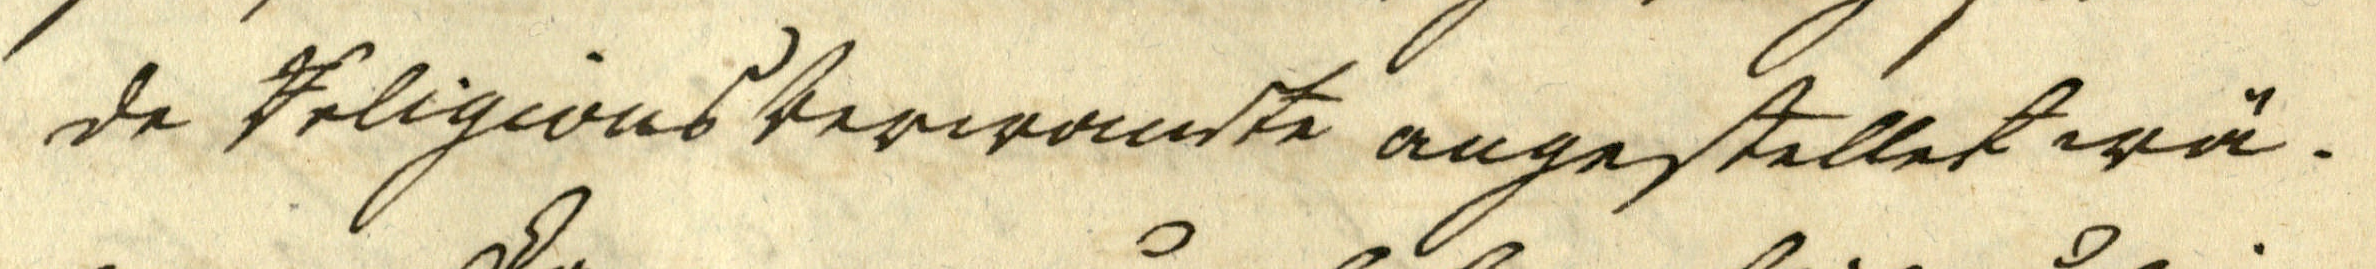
de ReligionsVerwandte angestellet wä¬
